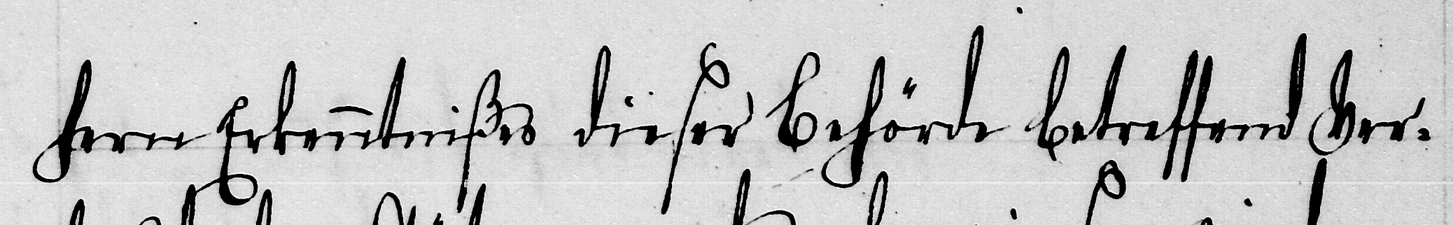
hern Erkenntnißes dieser Behörde betreffend Ver¬
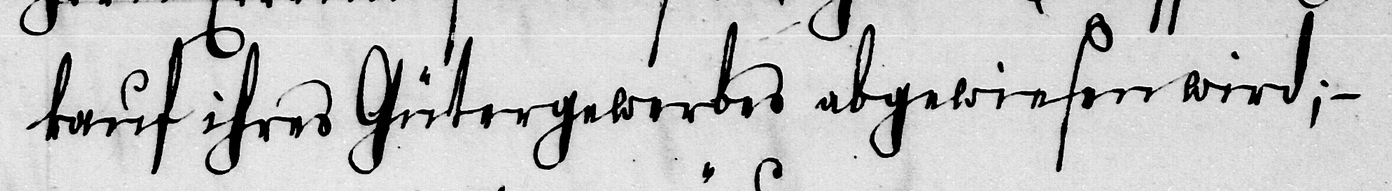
kauf ihres Gütergewerbes abgewiesen wird; –
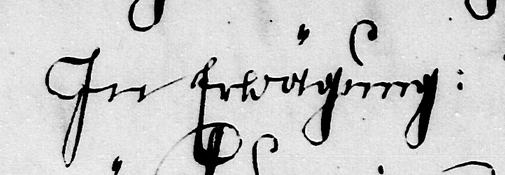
In Erwägung:
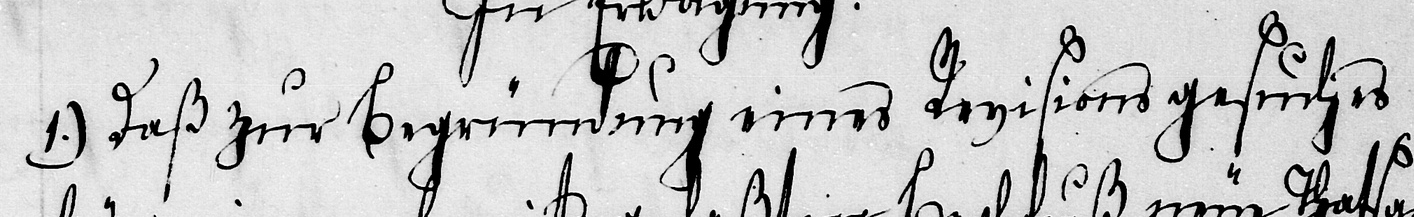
1.) Daß zur Begründung eines Revisionsgesuches
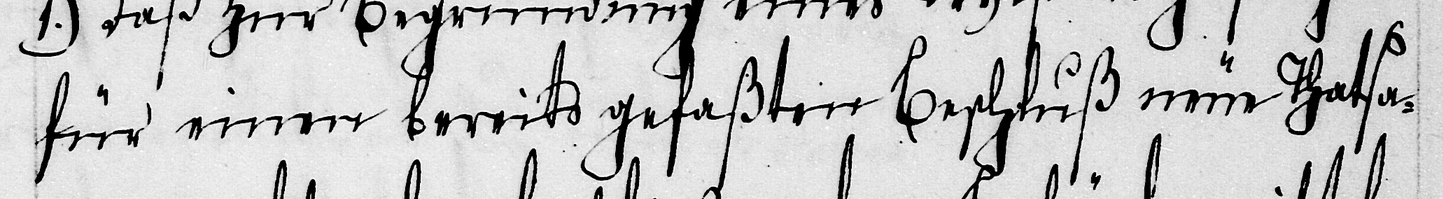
für einen bereits gefaßten Beschluß neue Thatsa¬
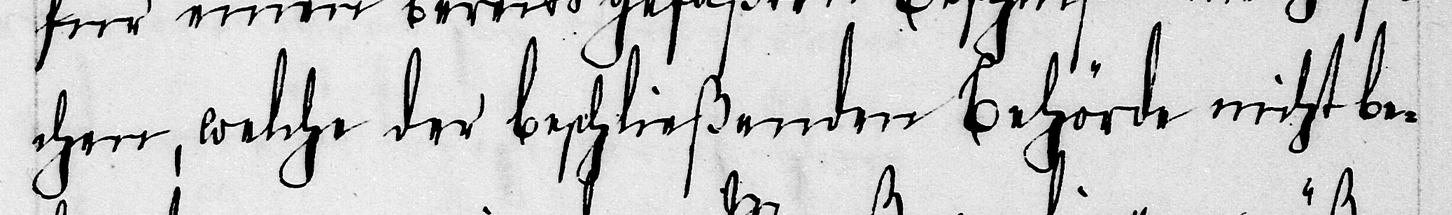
chen, welche der beschließenden Behörde nicht be¬
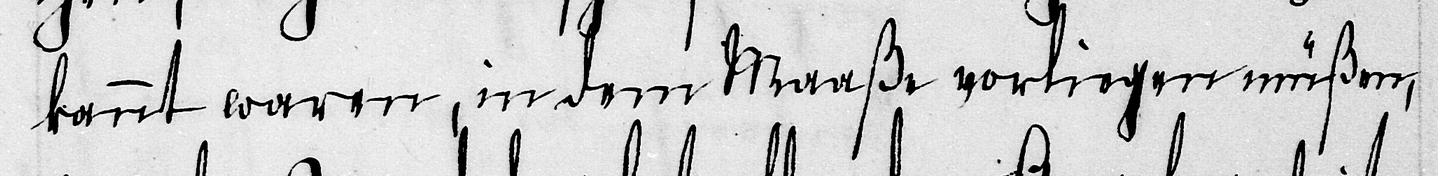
kannt waren, in dem Maaße vorliegen müßen,
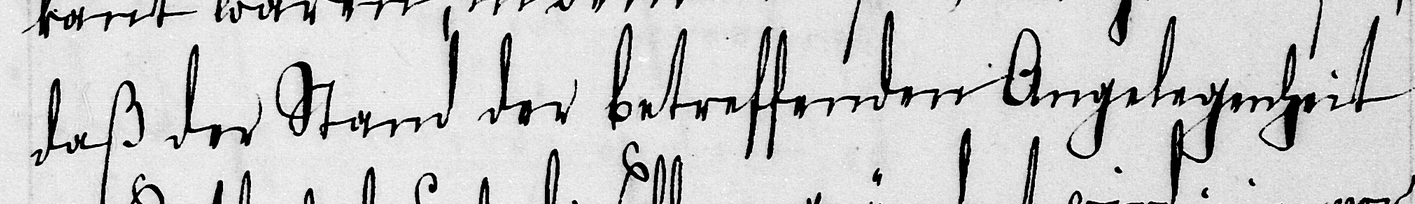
daß der Stand der betreffenden Angelegenheit
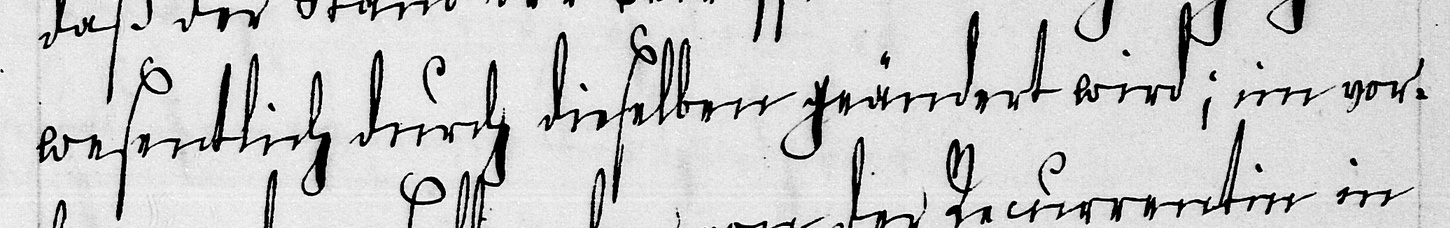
wesentlich durch dieselben geändert wird; im vor¬
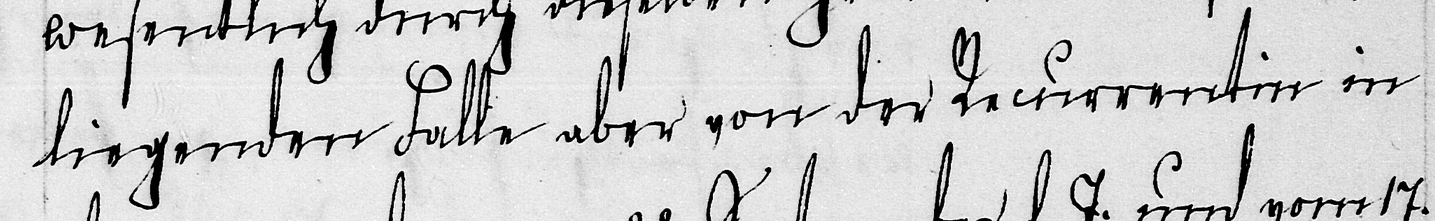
liegenden Falle aber von der Recurrentin in
